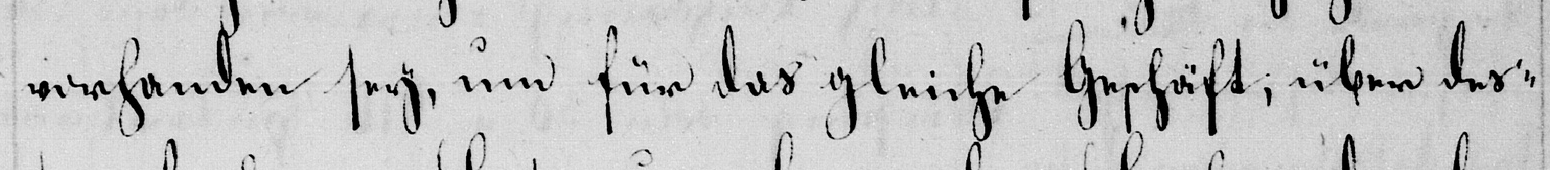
vorhanden sey, und für das gleiche Geschäft, über des¬
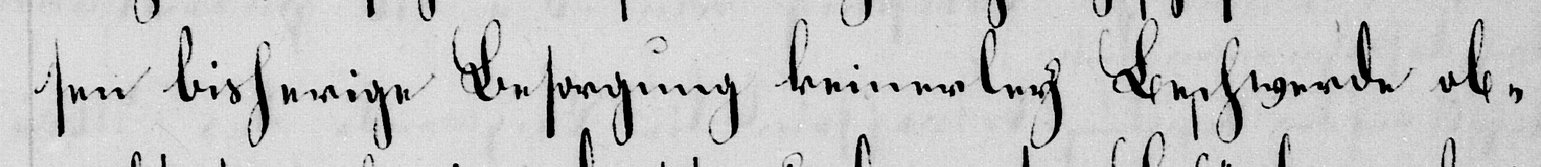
sen bisherige Besorgung keinerley Beschwerde ob¬
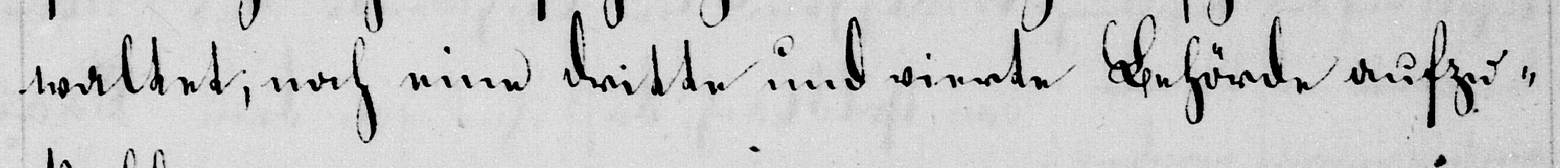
waltet, noch eine dritte und vierte Behörde aufzu¬
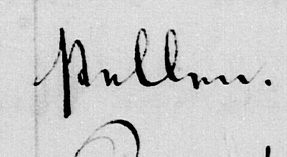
stellen.
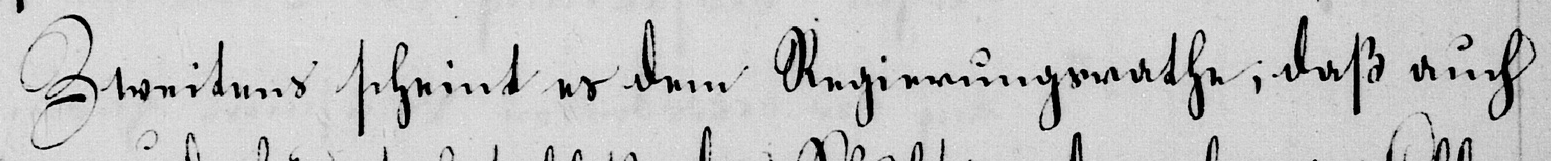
Zweitens scheint es dem Regierungsrathe, daß auch
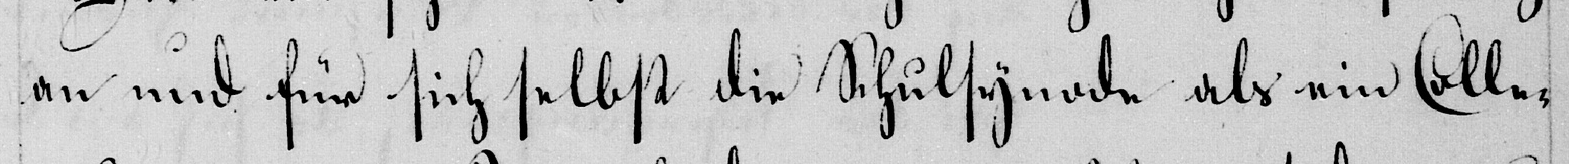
an und für sich selbst die Schulsynode als ein Colle¬
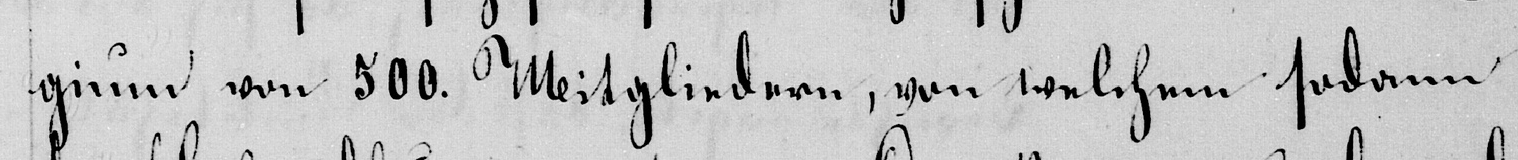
gium von 500. Mitgliedern, von welchem sodann
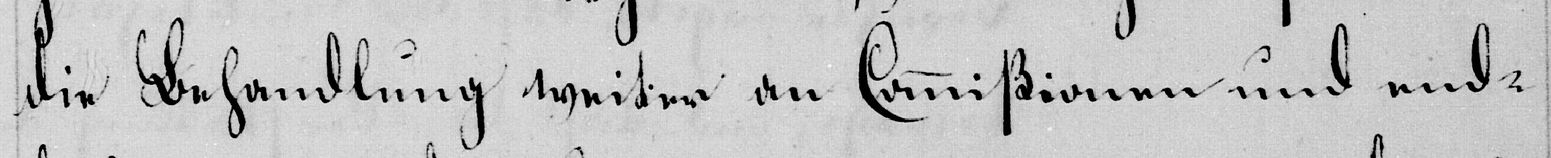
die Behandlung weiter an Commißionen und end¬
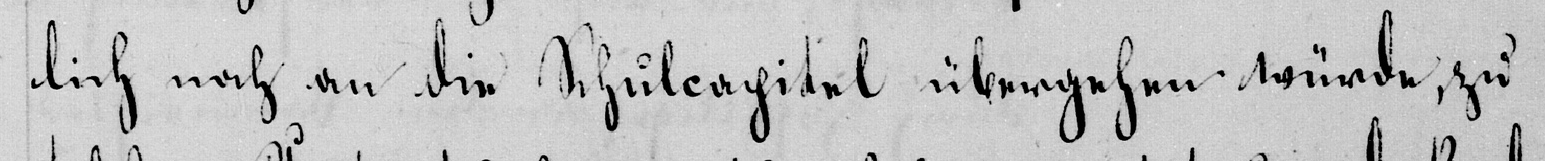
lich noch an die Schulcapitel übergehen würde, zu
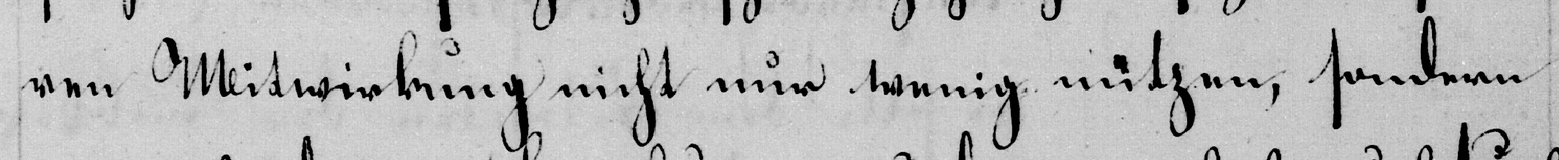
ren Mitwirkung nicht nur wenig nützen, sondern
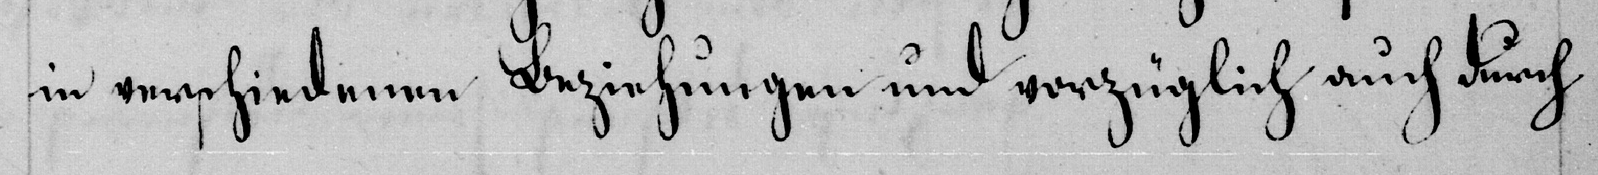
in verschiedenen Beziehungen und vorzüglich auch durch
